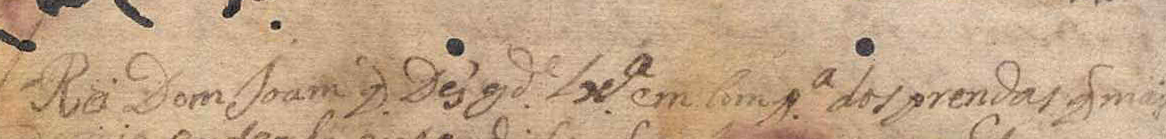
Rei Dom Joam q̄ Des̄ gd.e Lx.a em Comp.a dos prendas q̄ mas
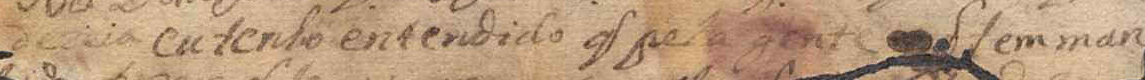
dezia eu tenho entendido q̄ pela gente q̄ tem man
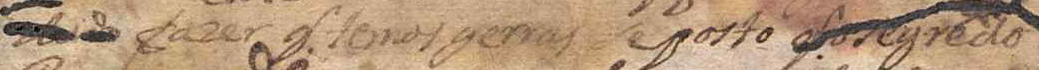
dado fazer q̄ temos gerras e posto q̄ o segredo
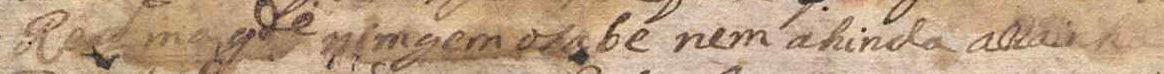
Real magd.e nimgem o sabe nem ahinda a Rainha
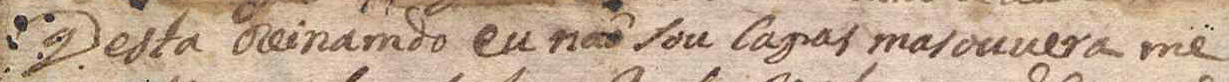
q̄ esta Reinamdo eu naõ sou Capas mas ouuera me
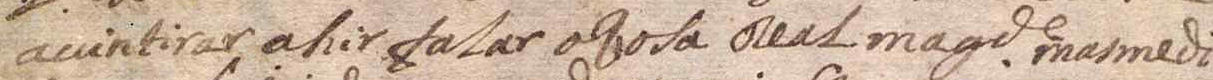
auintirar a hir falar o Vosa ReaL magd.e mas me di
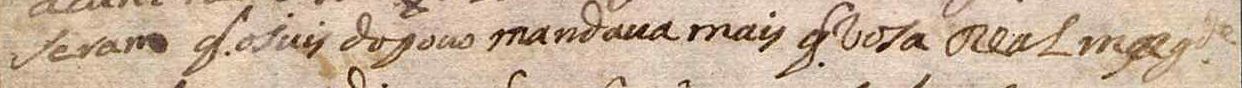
seram q̄. o iuis do pouo mandaua mais q̄ vosa Real mag.de
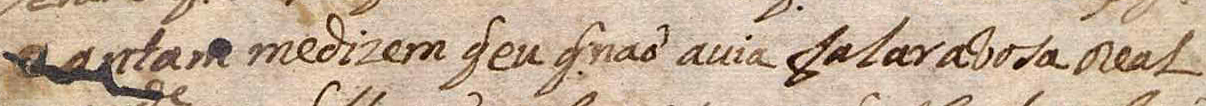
e antam me dizem q̄ eu q̄ naõ auia falar a vosa ReaL
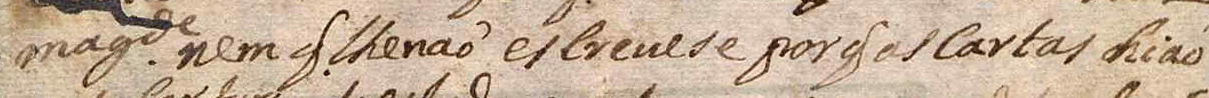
mag.de nem q̄ lhe naõ escreuese porq̄ as Cartas hiaõ
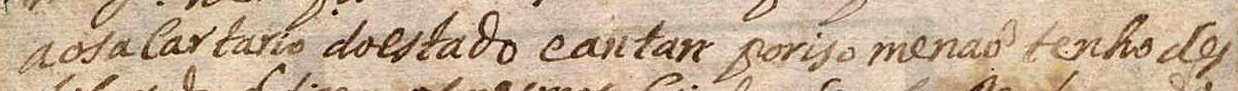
ao saCartario do estado e antan por iso me naõ tenho des
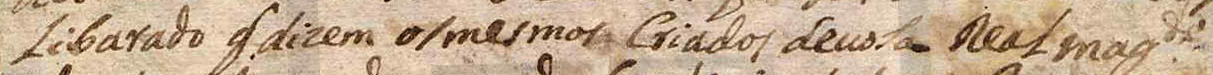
Libarado q̄ dizem os mesmos Criados de uosa Real magde
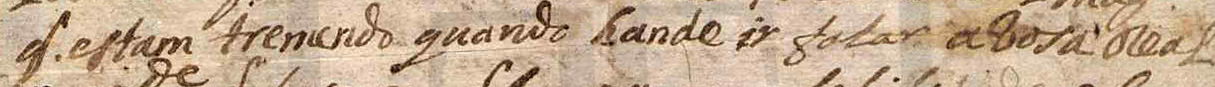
q̄ estam tremendo quando hande ir falar a vosa Real
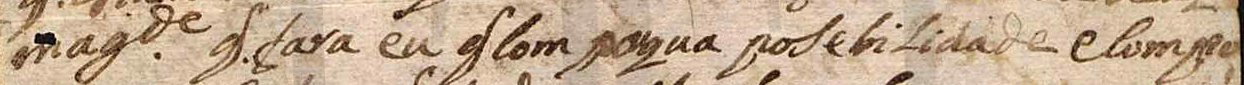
mag.de q̄ fara eu q̄ Com pouqua posebilidade e Com po
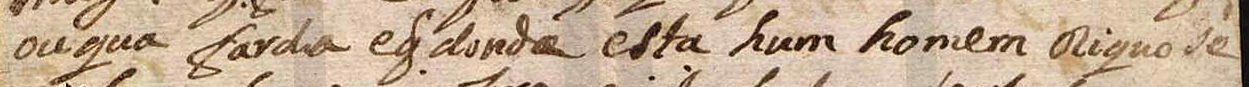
ouqua farda e q̄ doudo esta hum homem Riquo se
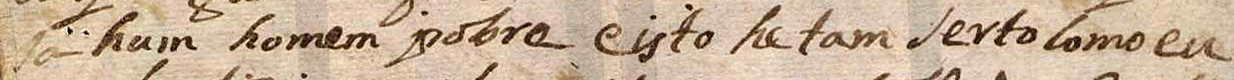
só hum homem pobre e isto he tam serto Como eu
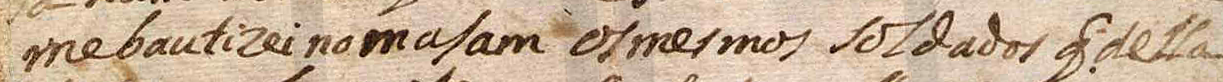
me bautizei no masam os mesmos soldados q̄ della
